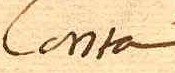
Conta
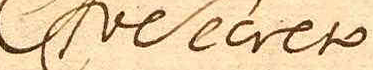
Ao Secreto
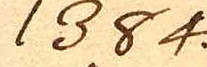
1384.
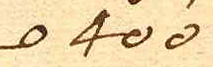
0400
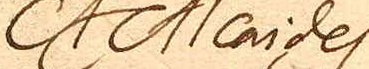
A Alcaides
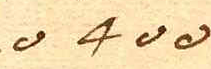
0400
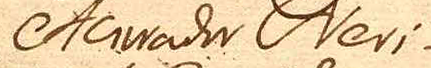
A curador Neri
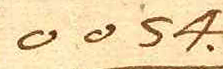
0054.
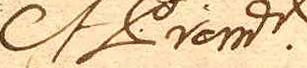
A Promor.
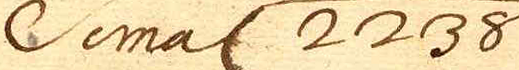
Soma 2238
